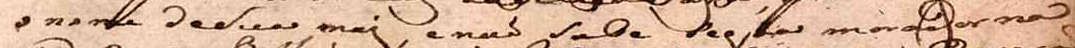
o nome de Sua maj, e naõ sabe seguia morador na
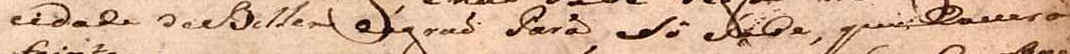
cidade de Bellem do graõ Pará, e sô sabe, que havera
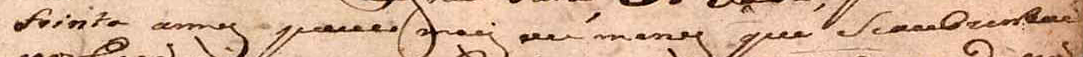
trinta annos pouco mais ou menos que se aubzentou
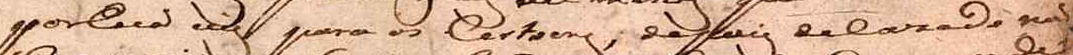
por hua vez para os Certoens, depois de cazado na
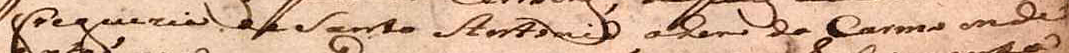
freguezia de Santo Antonio alem do Carmo onde
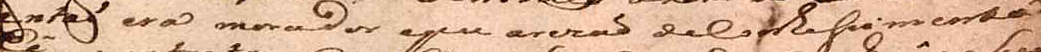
entaõ era morador e que a rezaõ de conhessimento
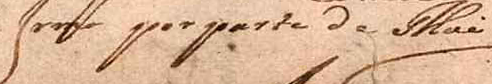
Jrma por parte de Mai
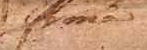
Irmaõ
